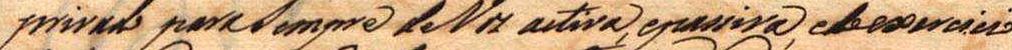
privado para Sempre de Voz activa, e passiva, e de exercicio
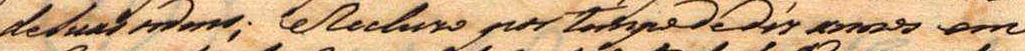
de Suas ordens; e Recluzo por tempo de dez annos em
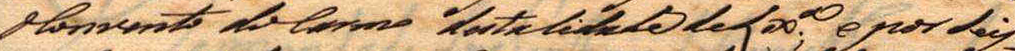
o Convento do Carmo desta Cidade de Lix;a e por seis
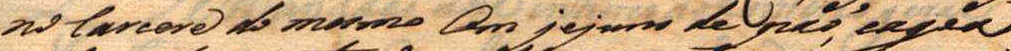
no Carcere do mesmo Com jejuns de paõ, e agoa
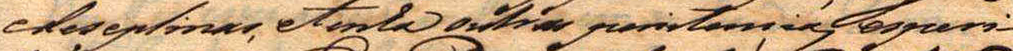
e deseplinas, e tenha outras penitensias esperi
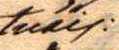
tuáis:
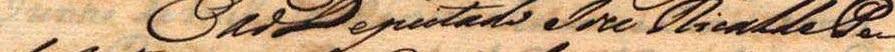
E ao Deputado Ioze Ricalle Pe
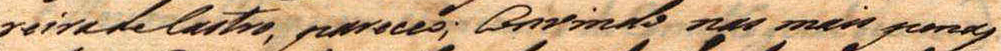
reira de Castro, pareceo; Convindo nas mais penas
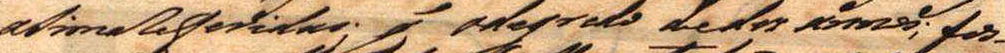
asima Referidas; q̄ o degredo de dez annos; fos
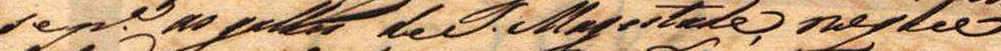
se p.a as galles de S. Magestade, no que
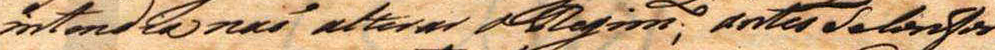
intendia naõ alterar o Regimto; antes se Confor
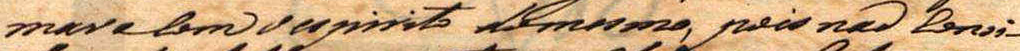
mava Com o espirito do mesmo, pois naõ Consi
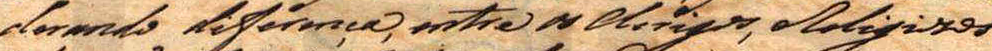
derando diferença, entre os Clerigos, e Religiozos
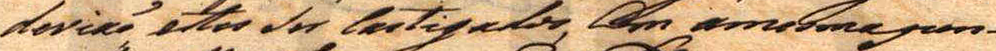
deviaõ estes ser Castigados, Com a mesma pen
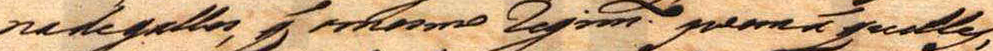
na de galles, que o mesmo Regim.to poem áquelles;
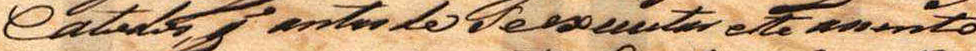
E a todos, q̄ antes de se executar este assento
